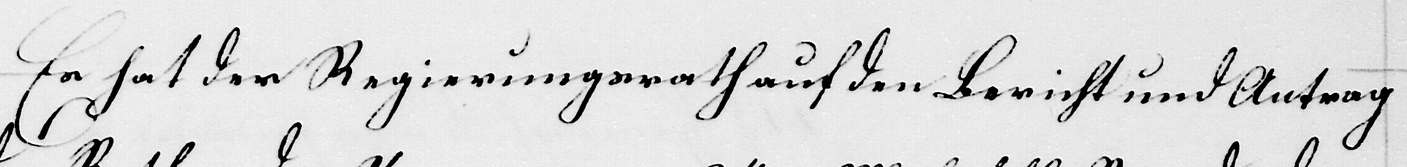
Es hat der Regierungsrath auf den Bericht und Antrag
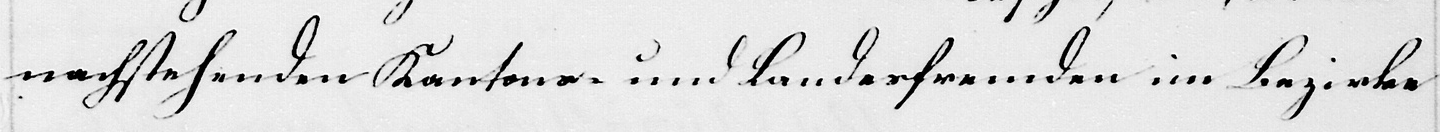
nachstehenden Kantons- und Landesfremden im Bezirke
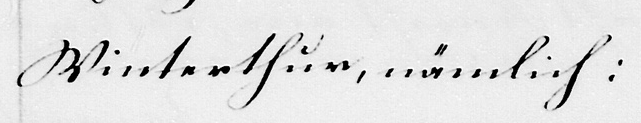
Winterthur, nämlich:
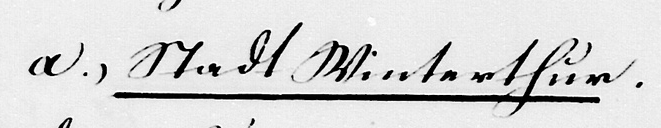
a.) Stadt Winterthur.
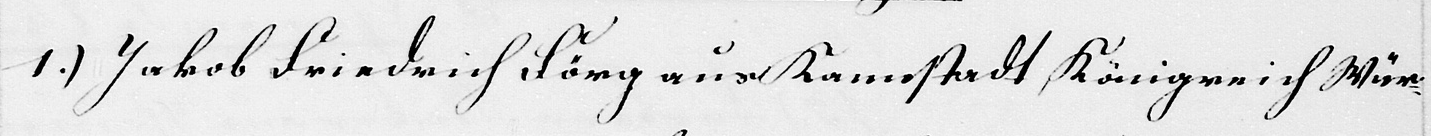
1.) Jakob Friedrich Förg aus Kannstadt, Königreich Wür¬
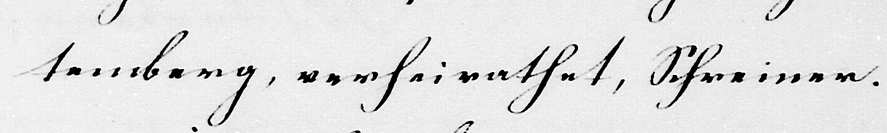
temberg, verheirathet, Schreiner.
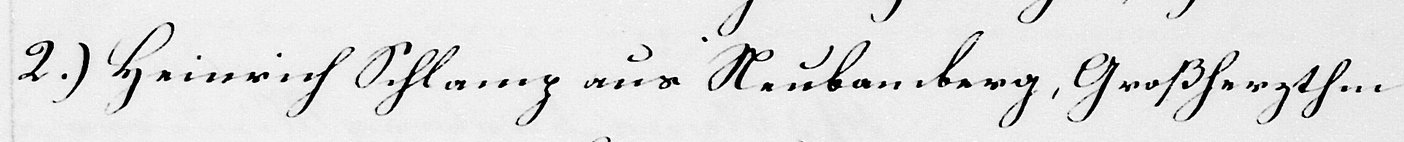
2.) Heinrich Schlanz aus Neubamberg, Großherzogthm
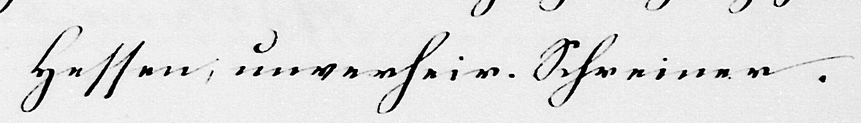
Hessen, unverheir. Schreiner.
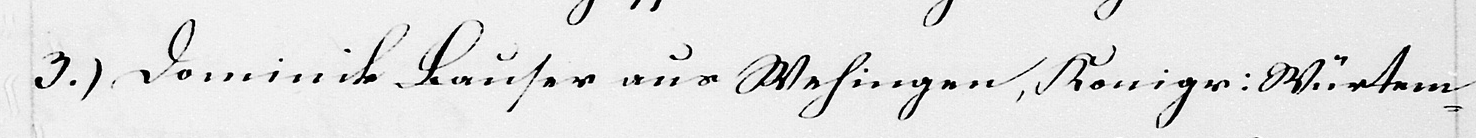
3.) Dominik Bauser aus Wehingen, Konigr: Würtem¬
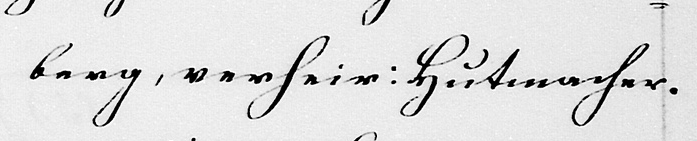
berg, verheir: Hutmacher.
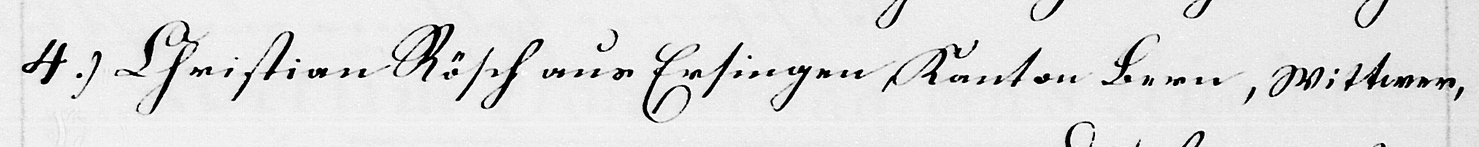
4.) Christian Rösch aus Ersingen, Kanton Bern, Wittwer,
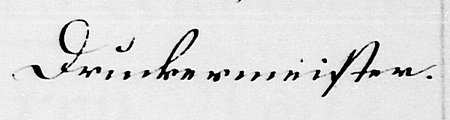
Druckermeister.
